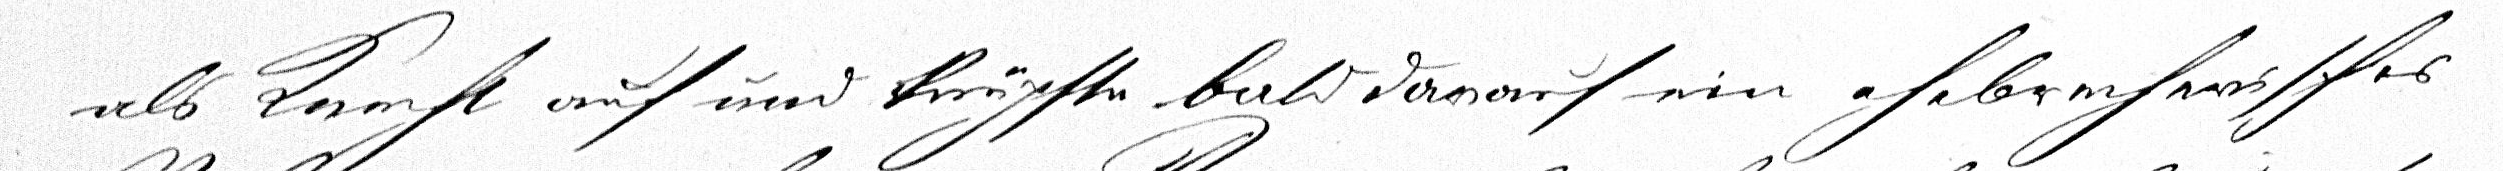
als Knecht auf und knüpfte bald daraus ein ehebrecherisches
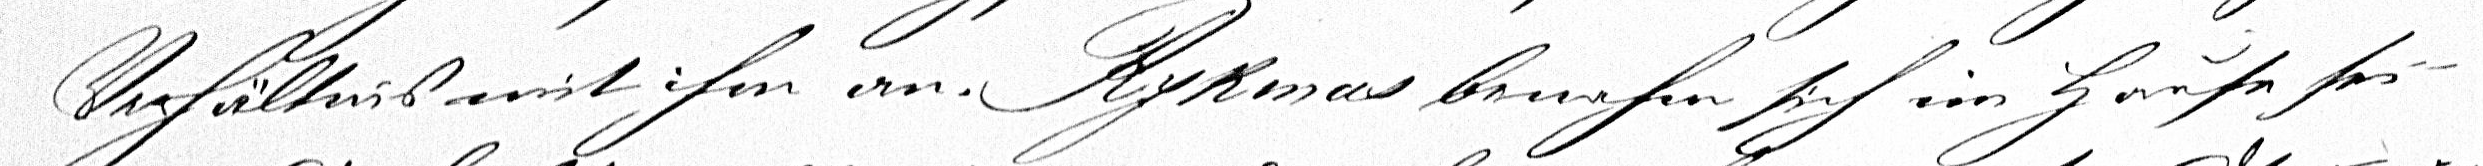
Verhältnis mit ihm an. Rykmas benahm sich im Haufe sei¬
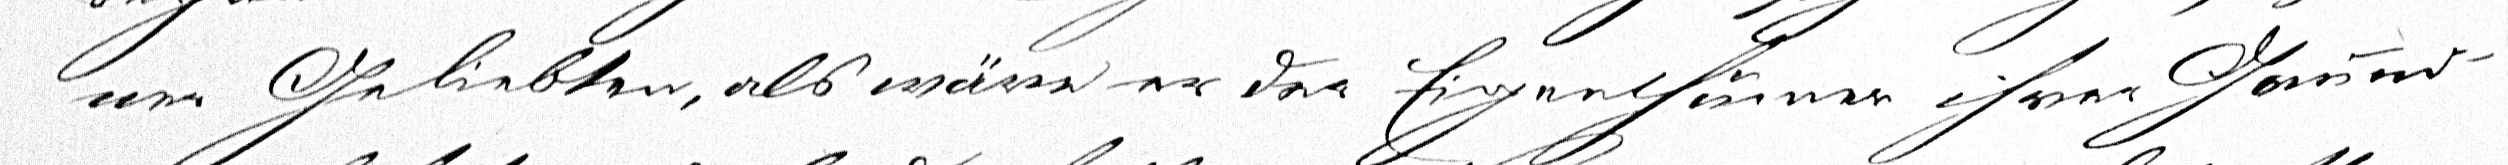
ner Geliebten, als wäre er der Eigenthümer ihrer Grund¬
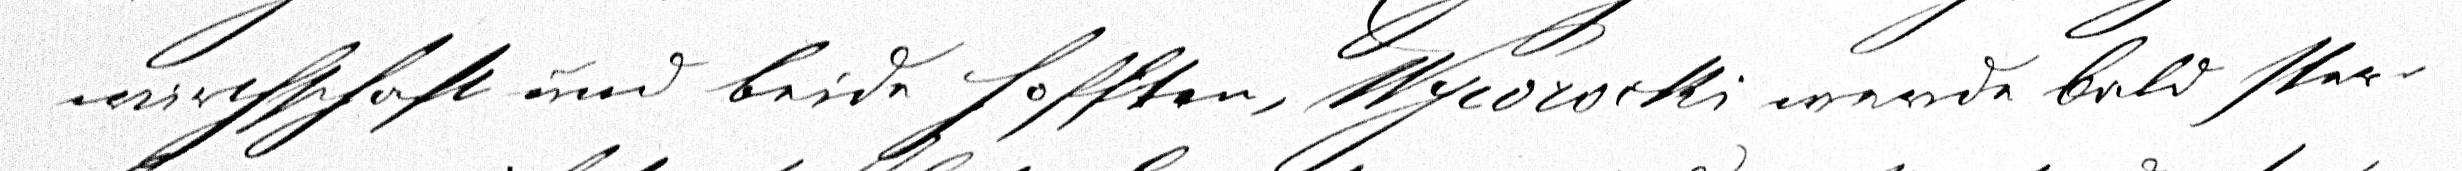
wirthschaft und beide hofften, Wywrocki werde bald ster¬
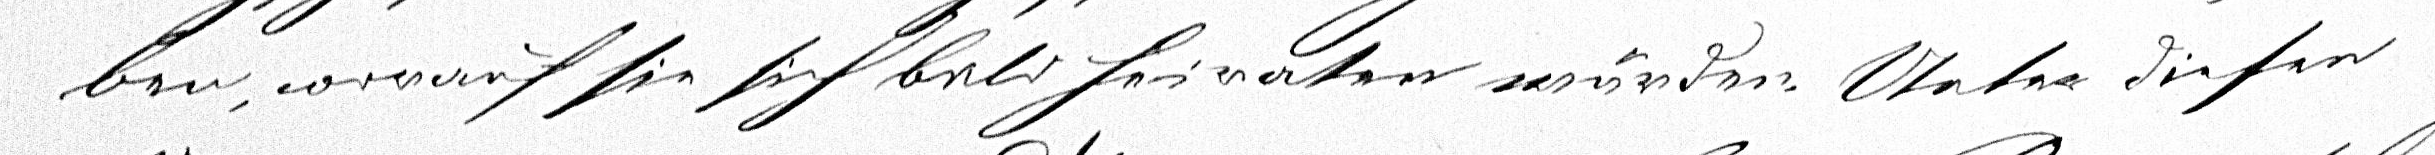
ben, worauf sie sich bald heiraten wüurden Unter diesen
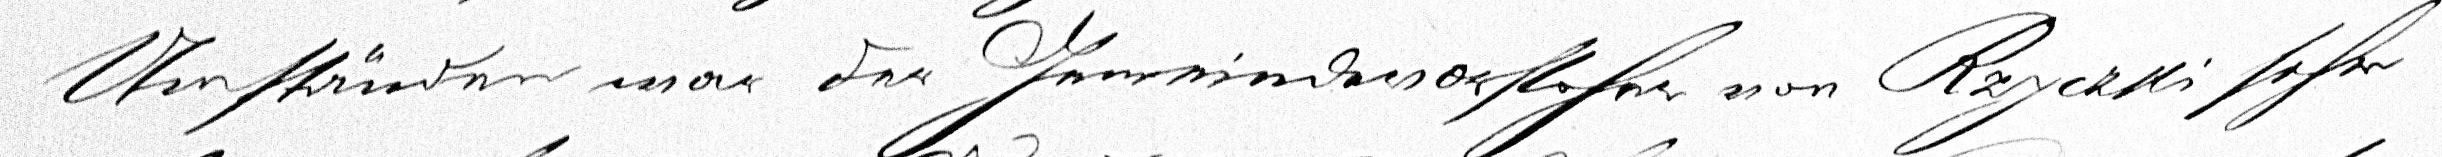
Umständen war der Gemeindevorsteher von Rzyczki sehr
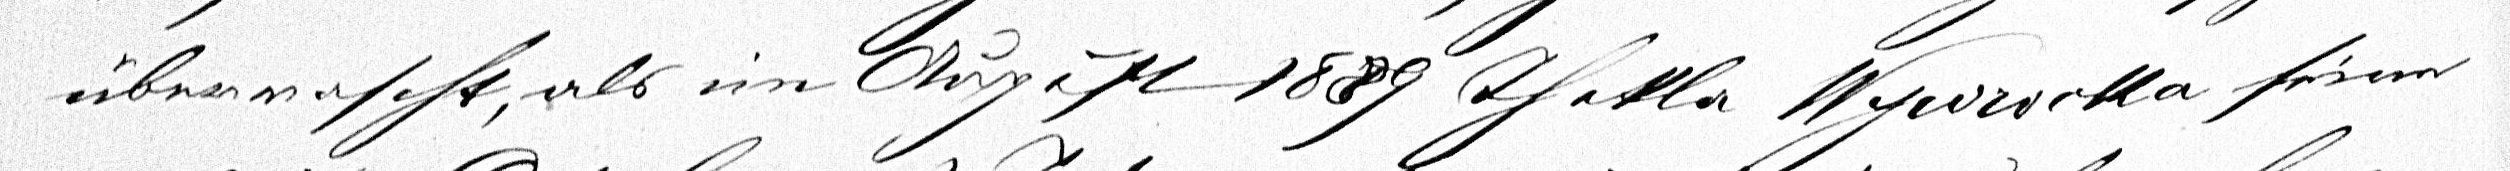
überrascht, als im August 1889 Thekla Wywrocka seine
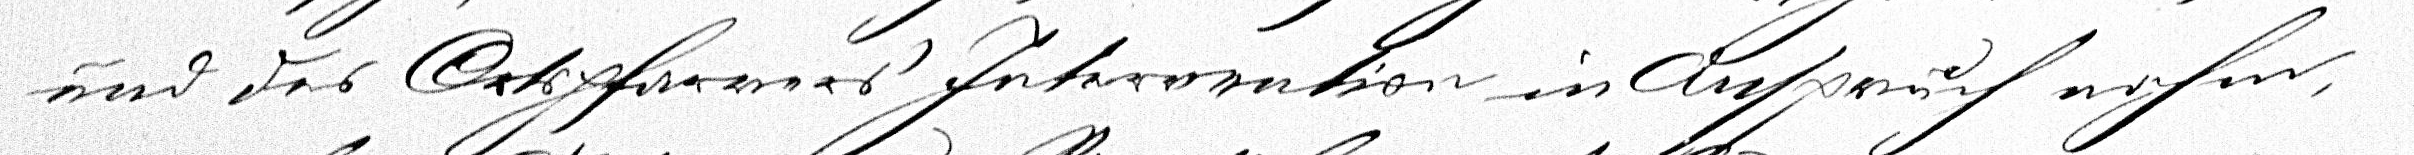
und des Ortspfarrers Intervention in Anspruch nahm,
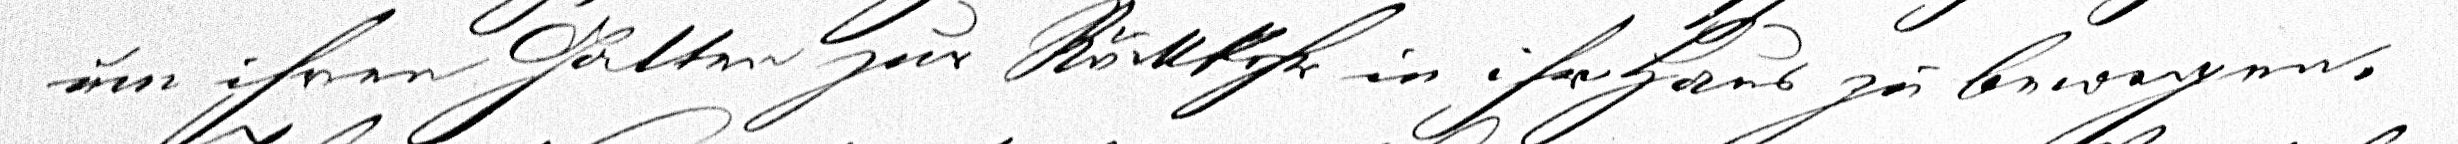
um ihren Gatten zur Rückkehr in ihr Haus zu bewegen.
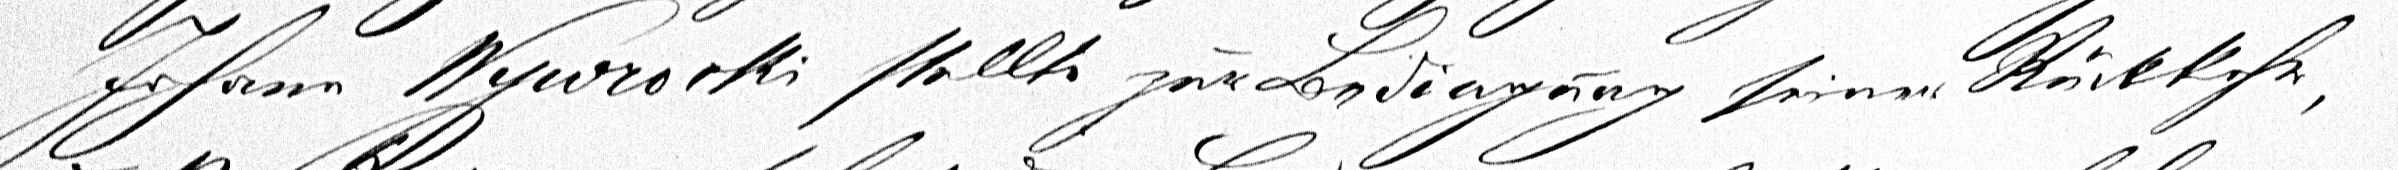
Johanne Wywrocki stellte zur Bedingung seiner Rückkehr,
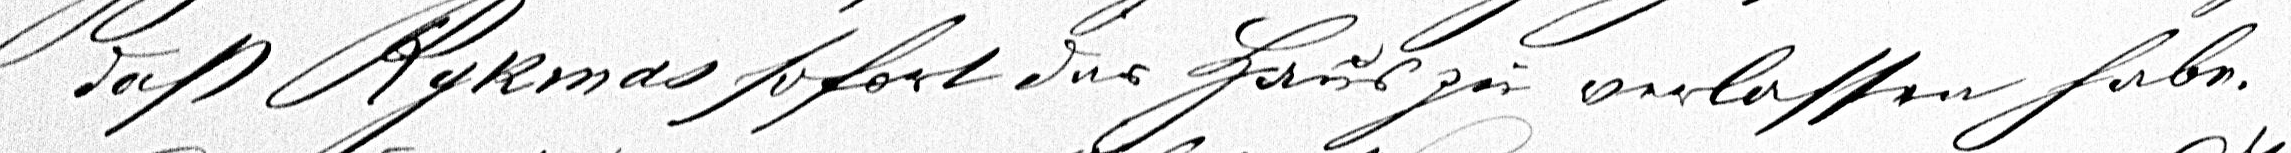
daß Rykmas sofort das Haus zu verlassen habe.
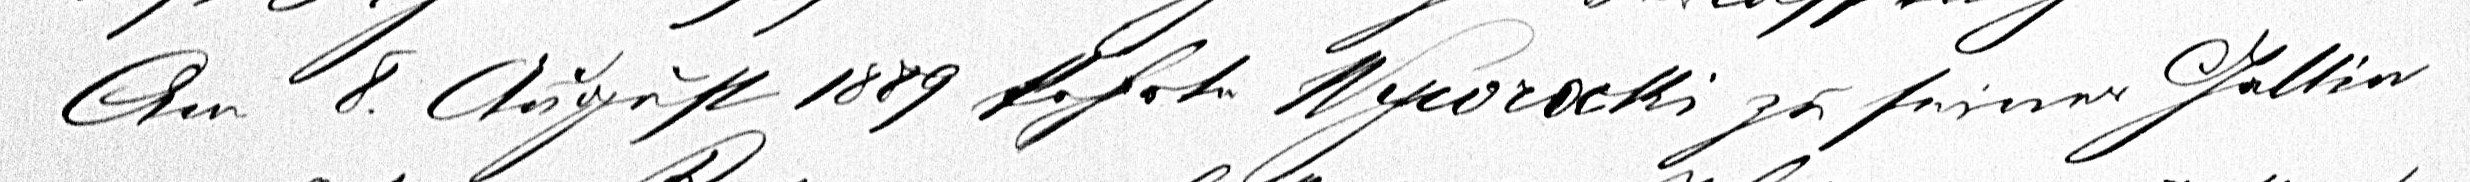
Am 8. August 1889 kehrte Wywrocki zu seiner Gattin
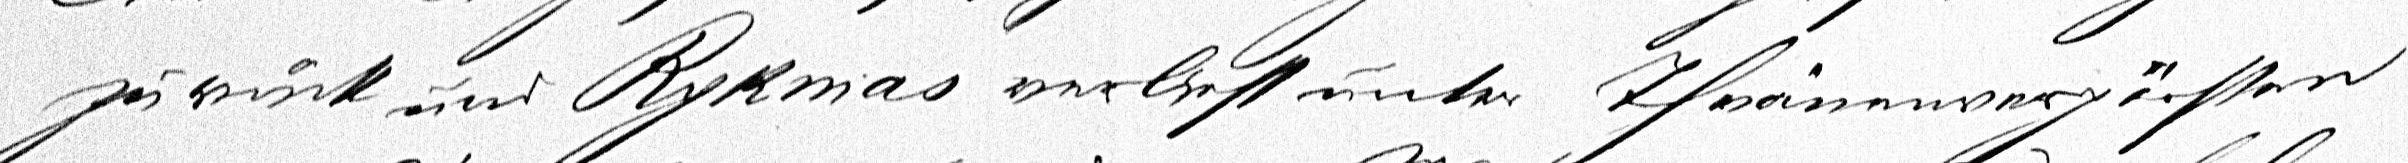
zurück und Rykmas verließ unter Thränenvergießen
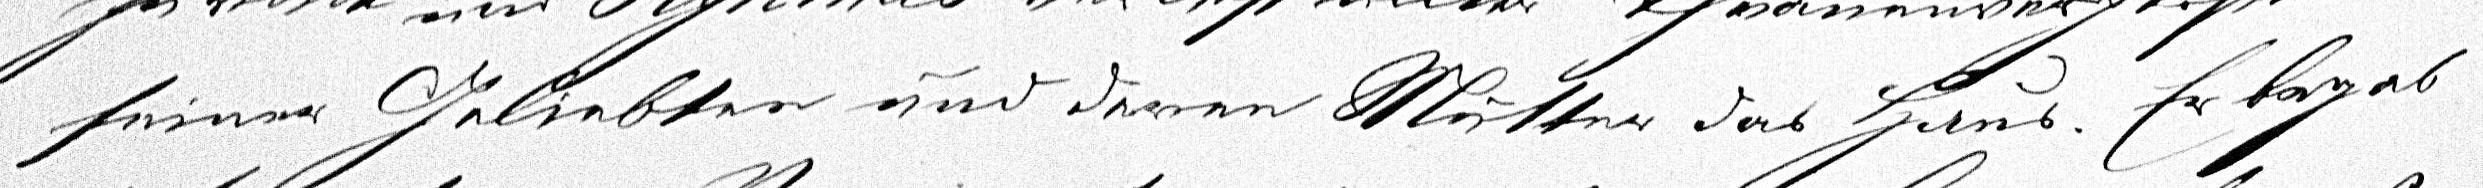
seiner Geliebten und deren Mutter das Haus. Ers begab
